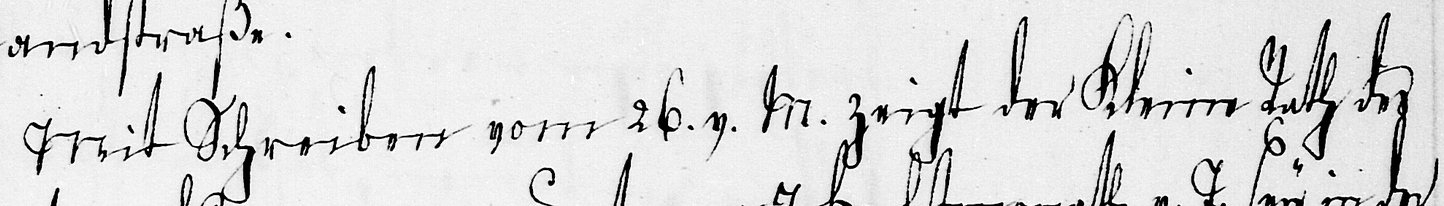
Mit Schreiben vom 26. v. M. zeigt der Kleine Rath des
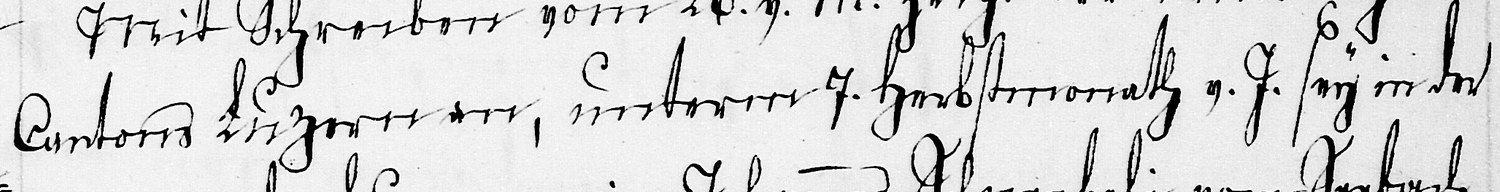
Cantons Luzern an, unterm 7. Herbstmonath v. J. sey in der
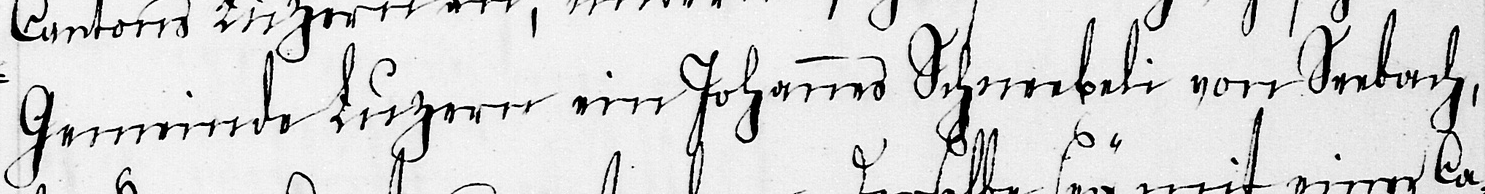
Gemeinde Luzern ein Johannes Schneebeli von Seebach,
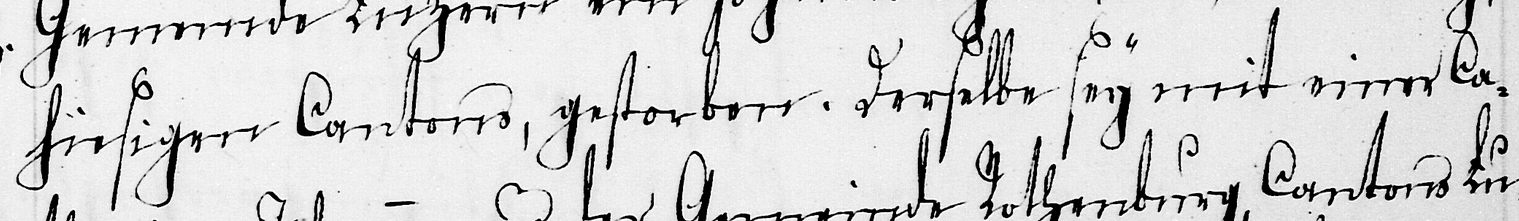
hiesigen Cantons, gestorben. Derselbe sey mit einer Ca¬
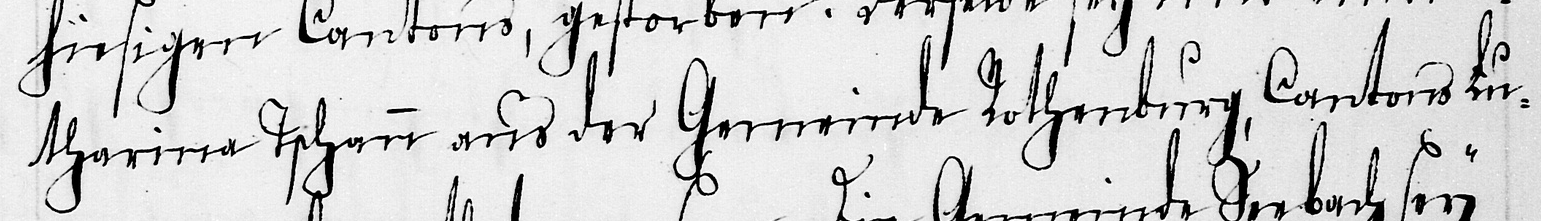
tharina Tschann aus der Gemeinde Rothenburg, Cantons Lu¬
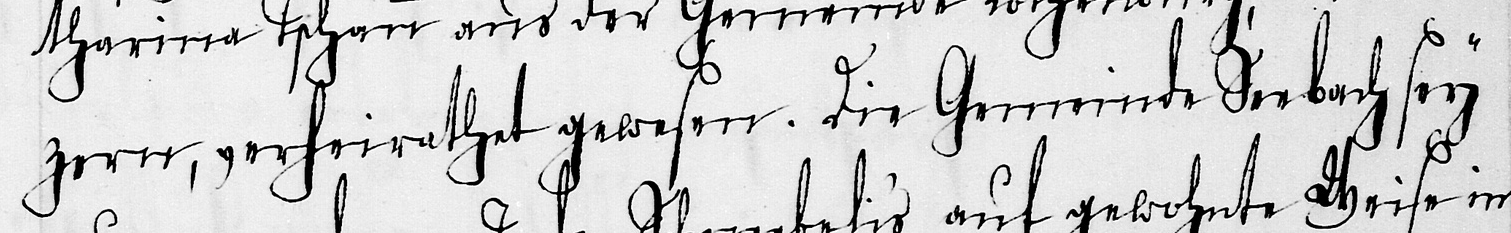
zern, verheirathet gewesen. Die Gemeinde Seebach sey
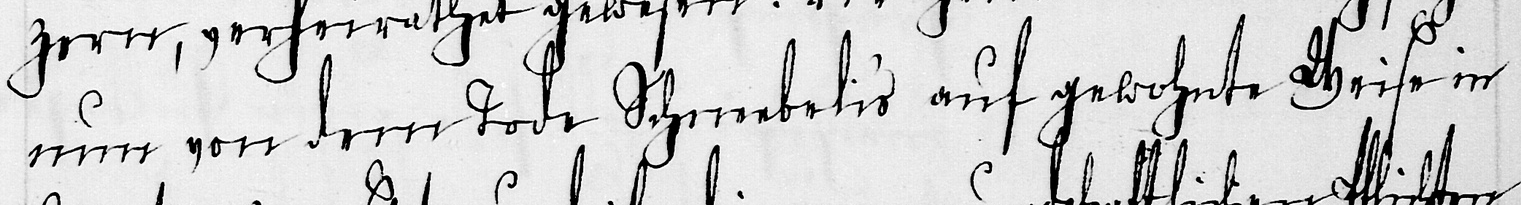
nun von dem Tode Schneebeli’s auf gewohnte Weise in
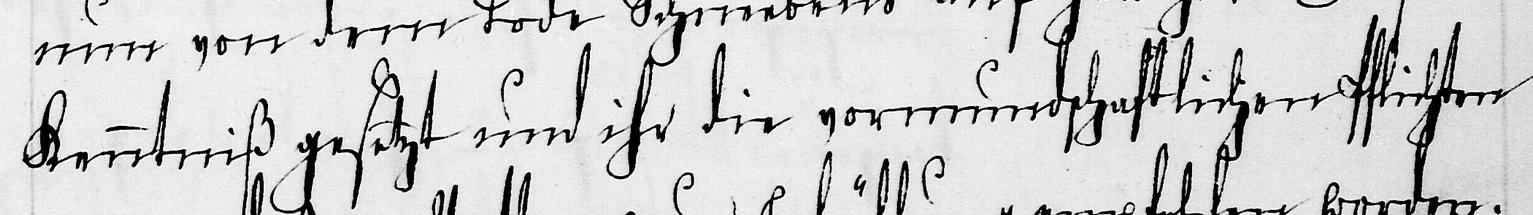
Kenntniß gesetzt und ihr die vormundschaftlichen Pflichten
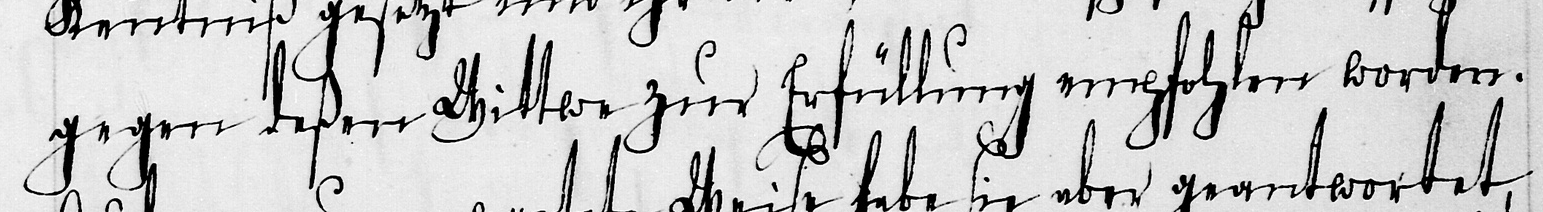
gegen deßen Wittwe zur Erfüllung empfohlen worden.
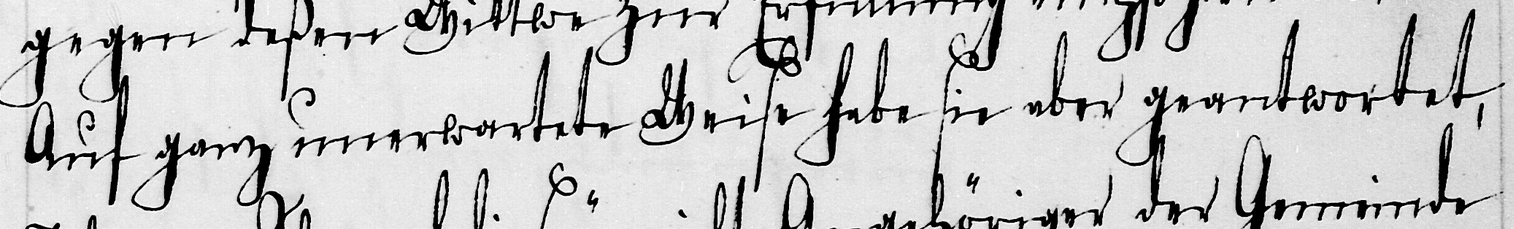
Auf ganz unerwartete Weise habe sie aber geantwortet,
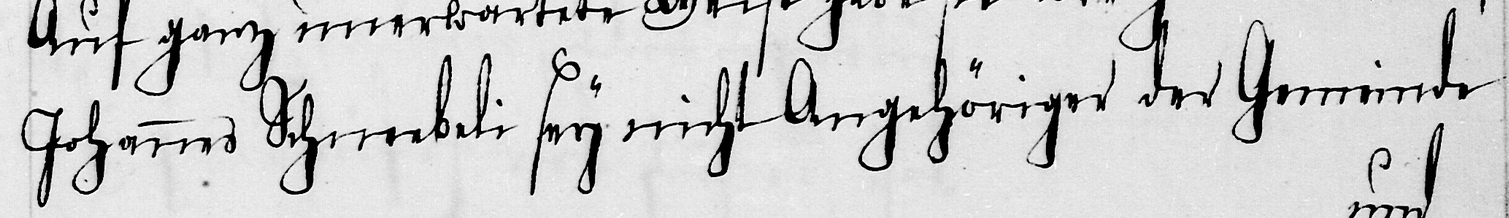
Johannes Schneebeli sey nicht Angehöriger der Gemeinde
